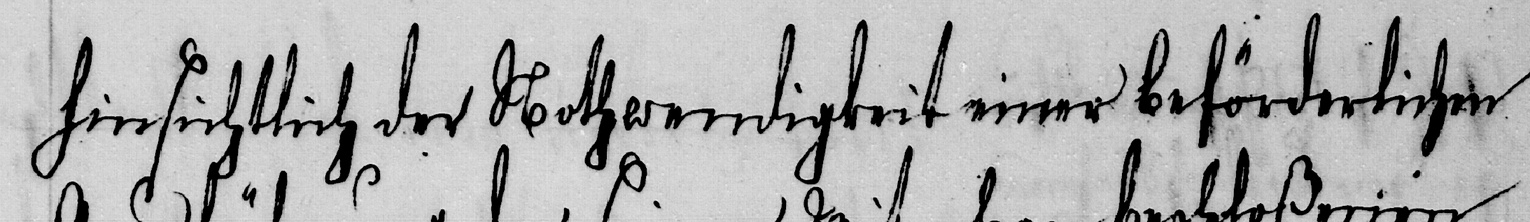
hinsichtlich der Nothwendigkeit einer beförderlichen
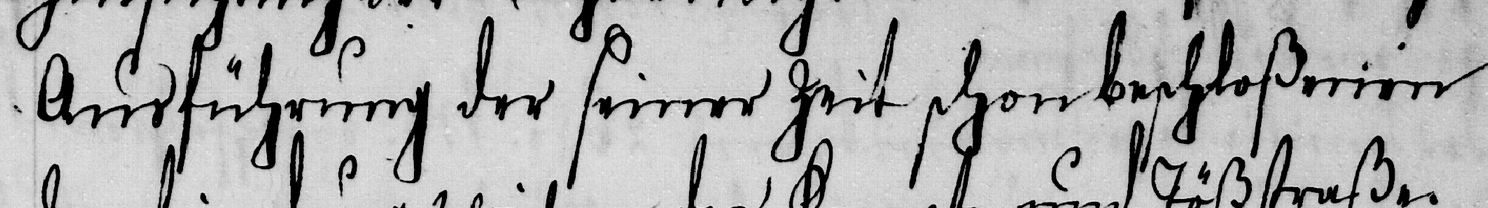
Ausführung der seiner Zeit schon beschloßenen
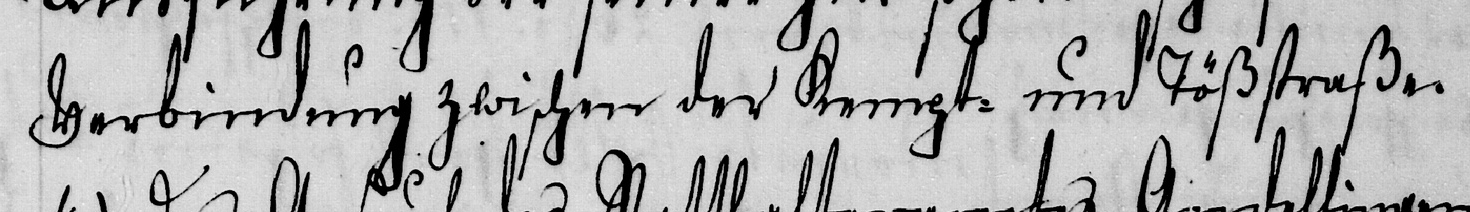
Verbindung zwischen der Kempt- und Tößstraße.
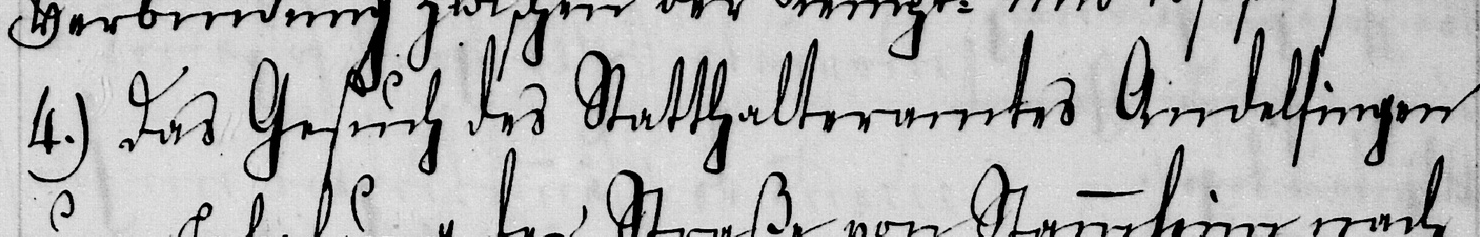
4.) Das Gesuch des Statthalteramtes Andelfingen
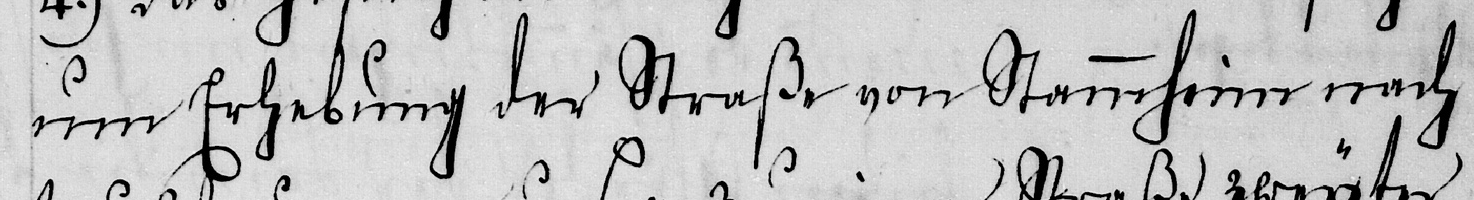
um Erhebung der Straße von Stammheim nach
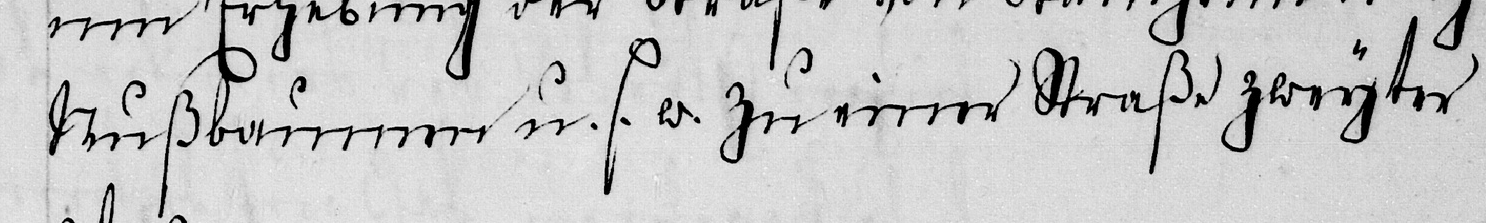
Nußbaumen u.s.w. zu einer Straße zweyter
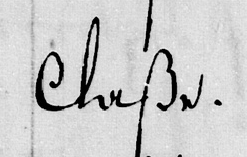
Claße.
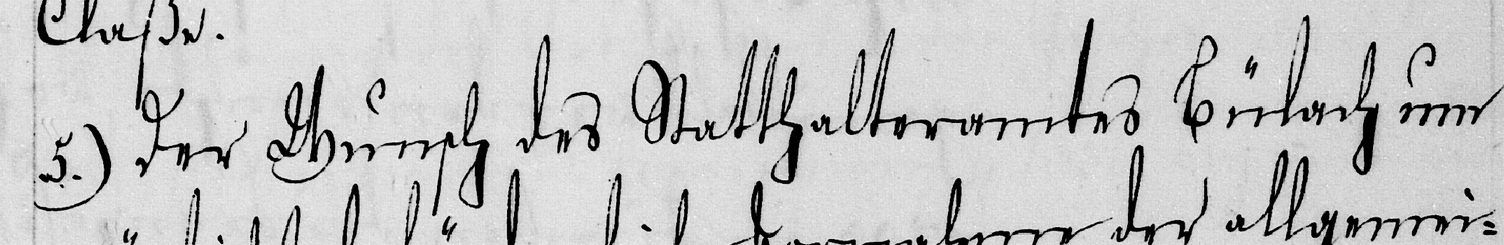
5.) Der Wunsch des Statthalteramtes Bülach um
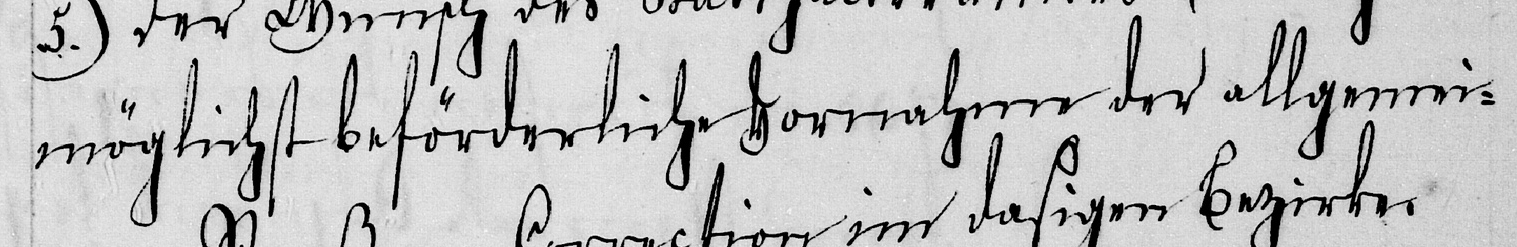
möglichst beförderliche Vornahme der allgemei¬
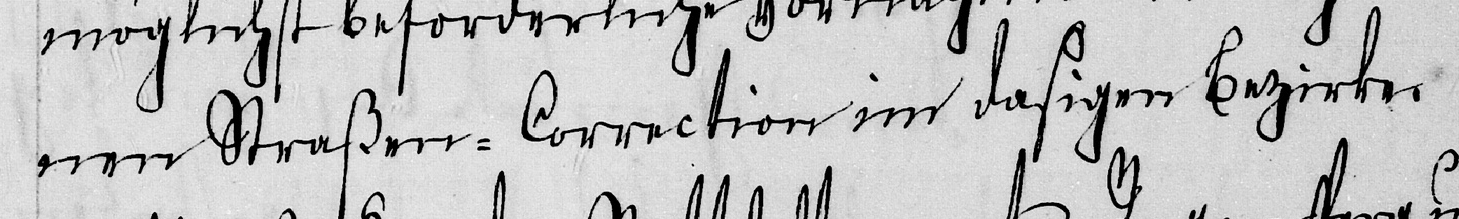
nen Straßen-Correction im dasigen Bezirke.
